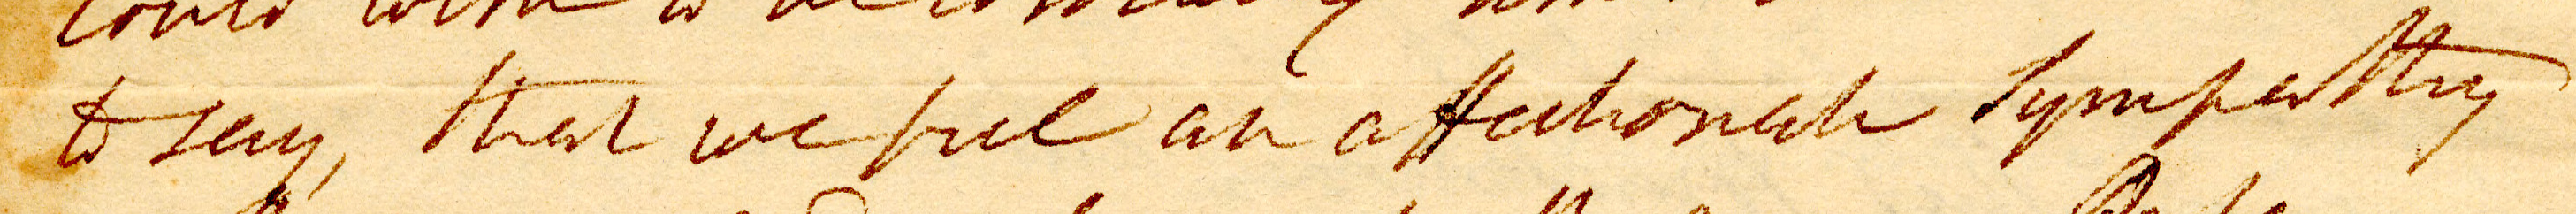to say, that we feel an affectionate sympathy
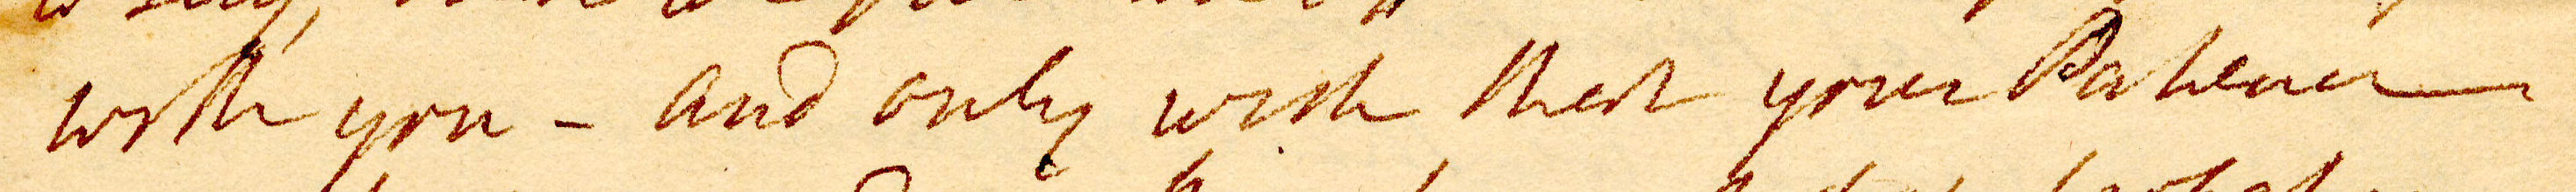with you- and only wish that your Patience
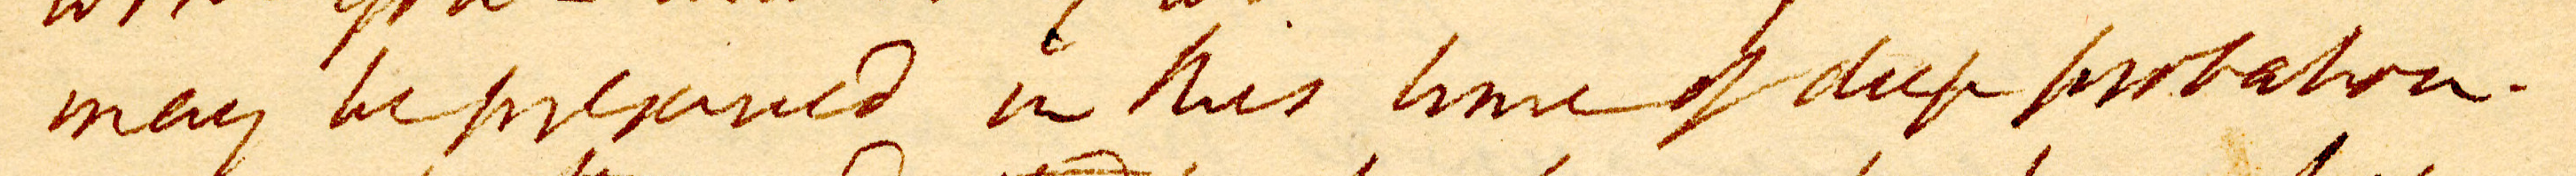my be prepared in this time of deep probation.
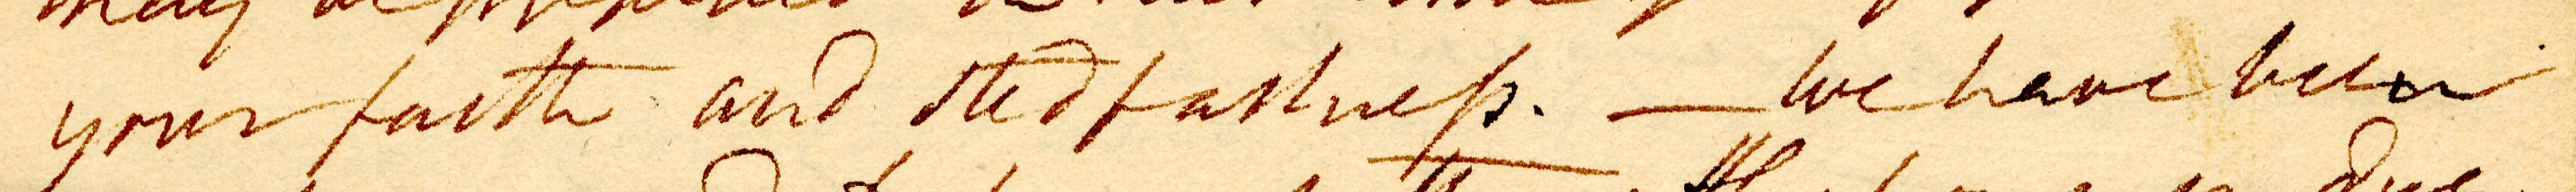your faith and stedfastness.- We have been
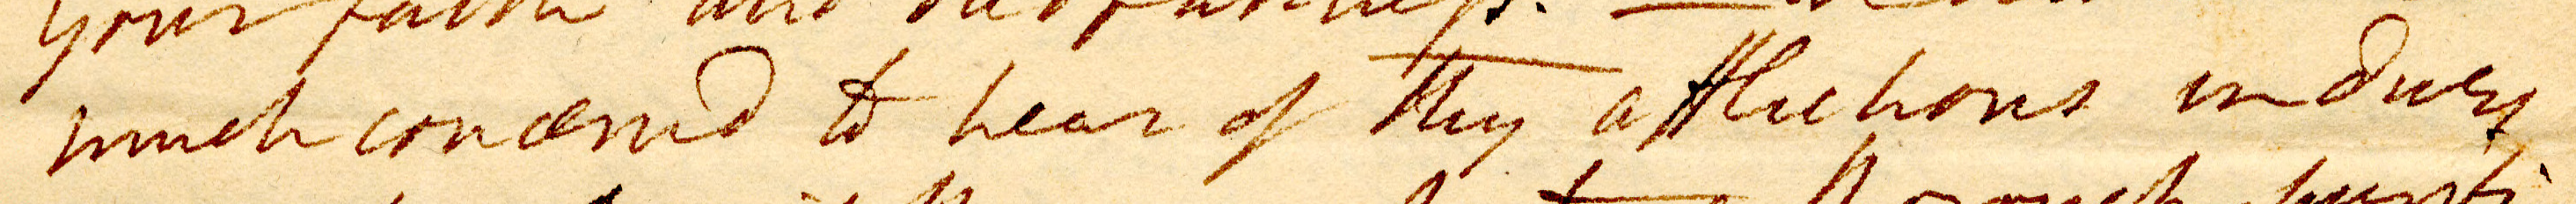much concernd to hear of thy afflictions in direct
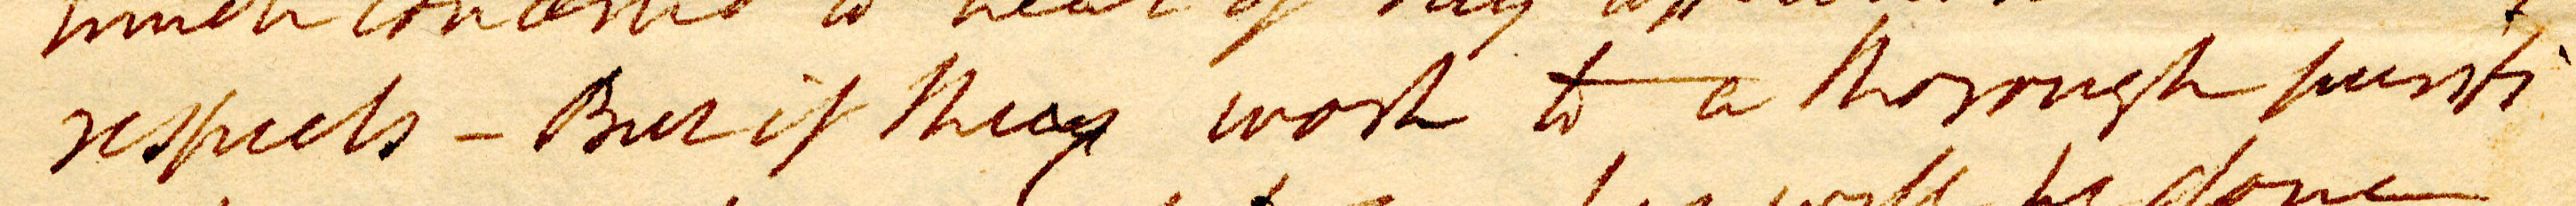respects- But if they work to a thorough purifi
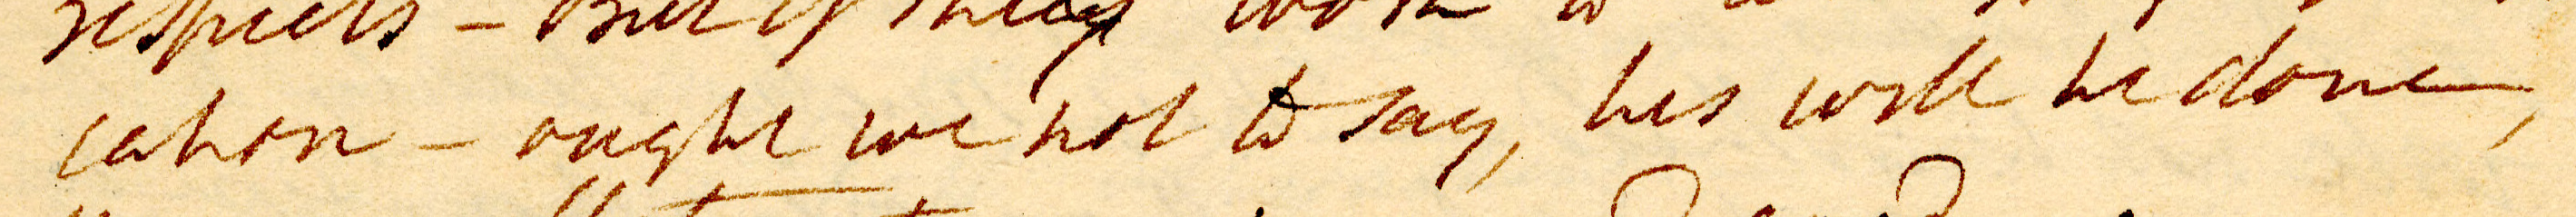cation- ought we not to say, his work be done,
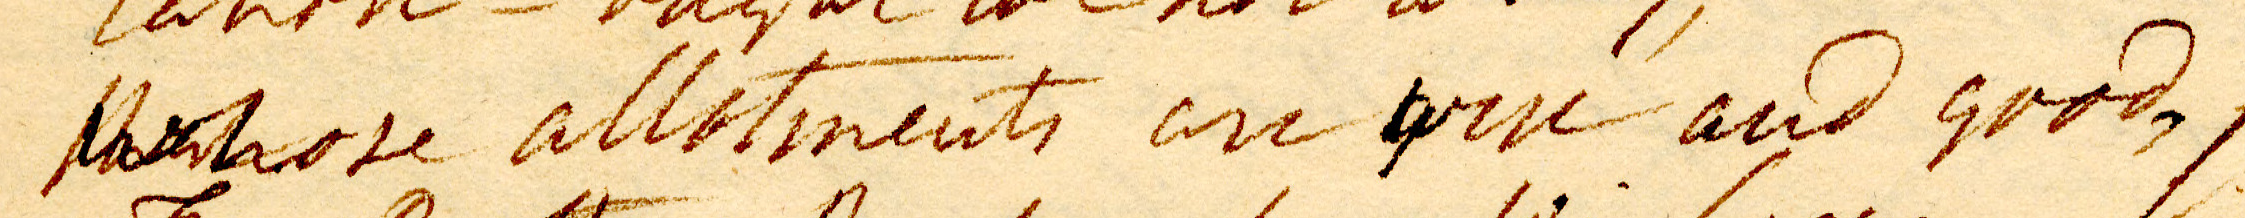whose allotments are wise and good,
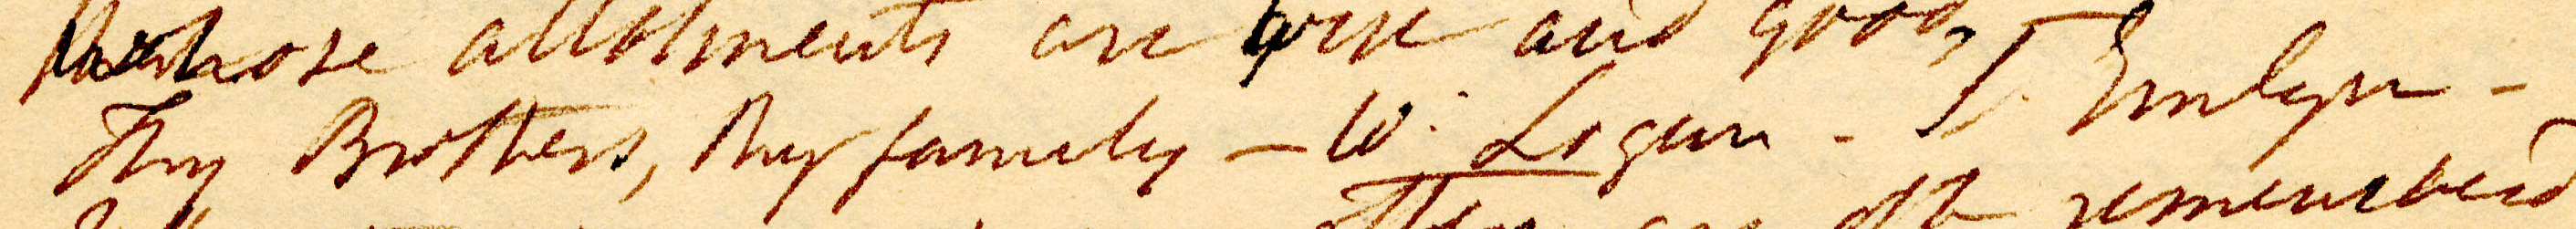Thy Brothers, Thy family- W. Logan, S. Emlyn-
